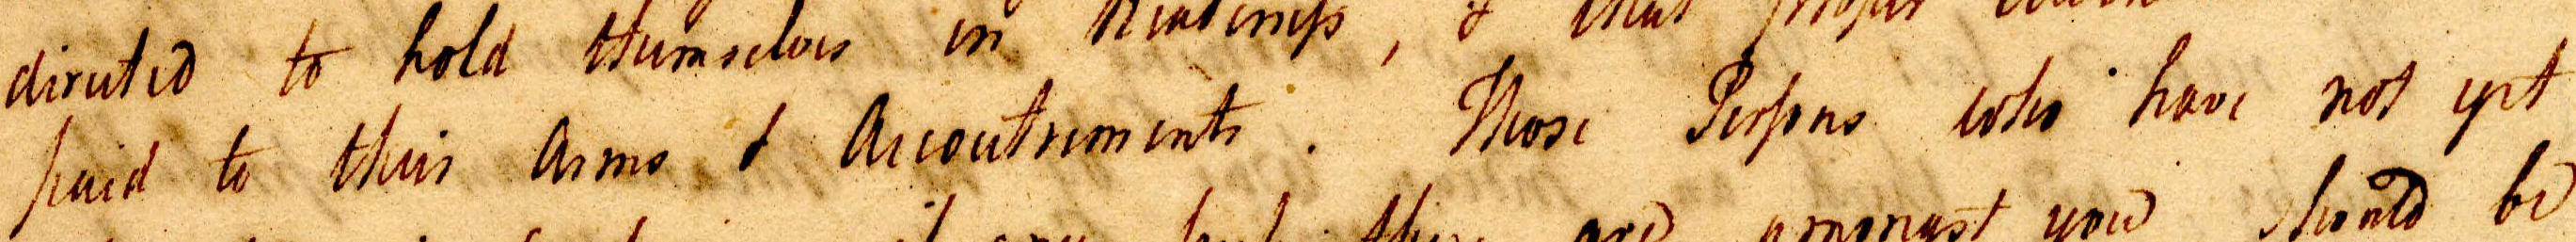paid to their Arms & Accoutrements. Those Persons who have not yet
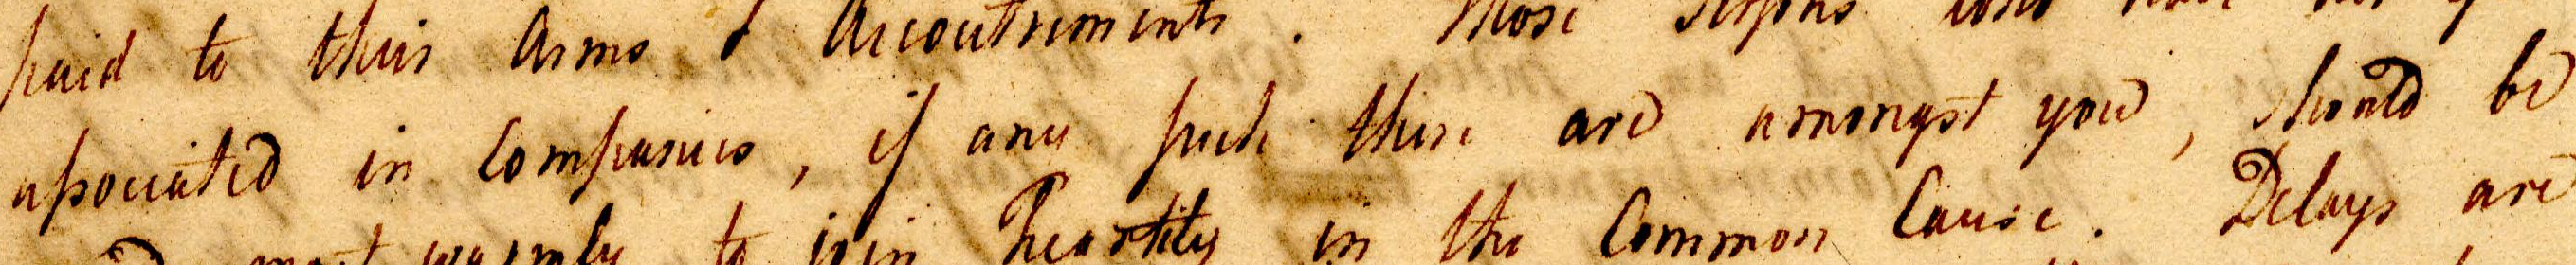associated in Companies, if any such then are amongst you, should be
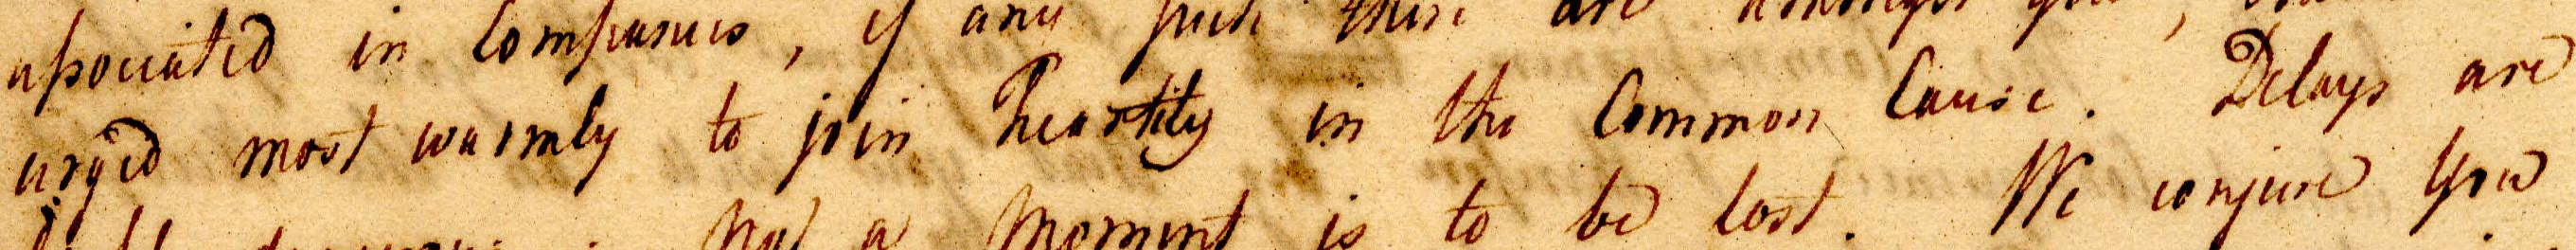urged most warmly to join heartily in the Common Cause. Delays are
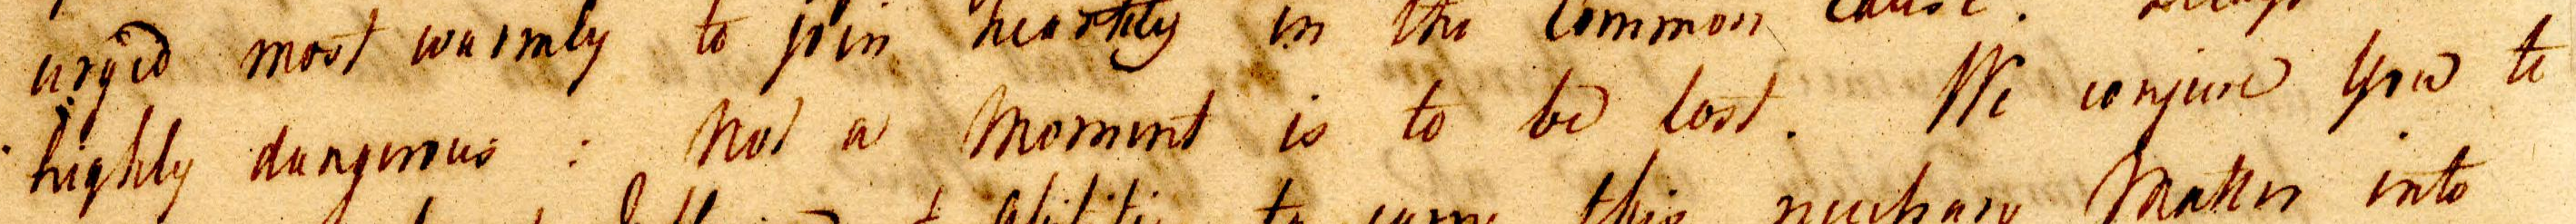highly dangerous: Not a moment is to be lost. We conjure you to
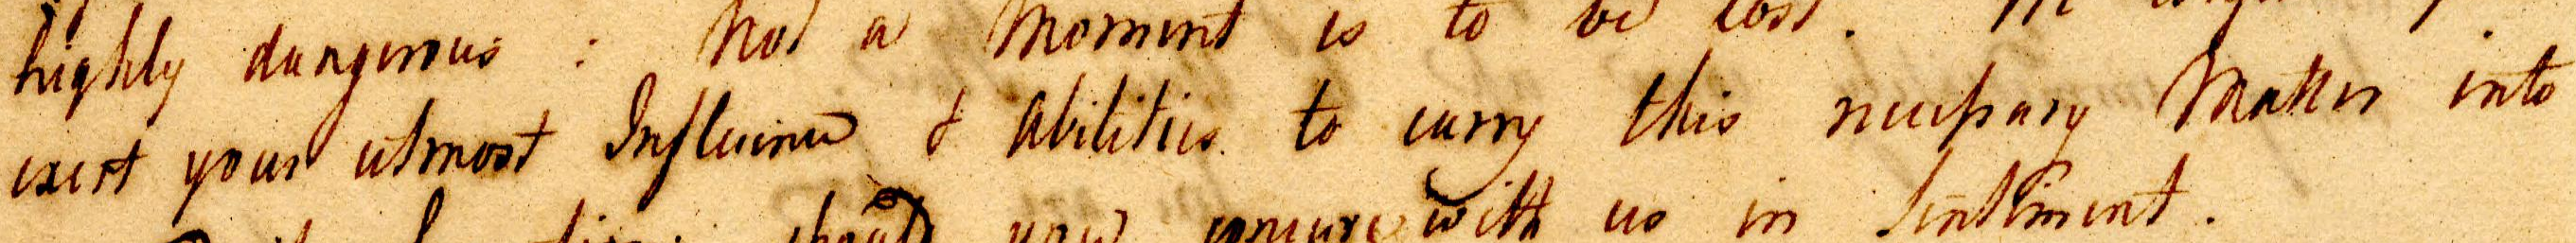exert your utmost Influence & Abilities to carry this necessary Matter into
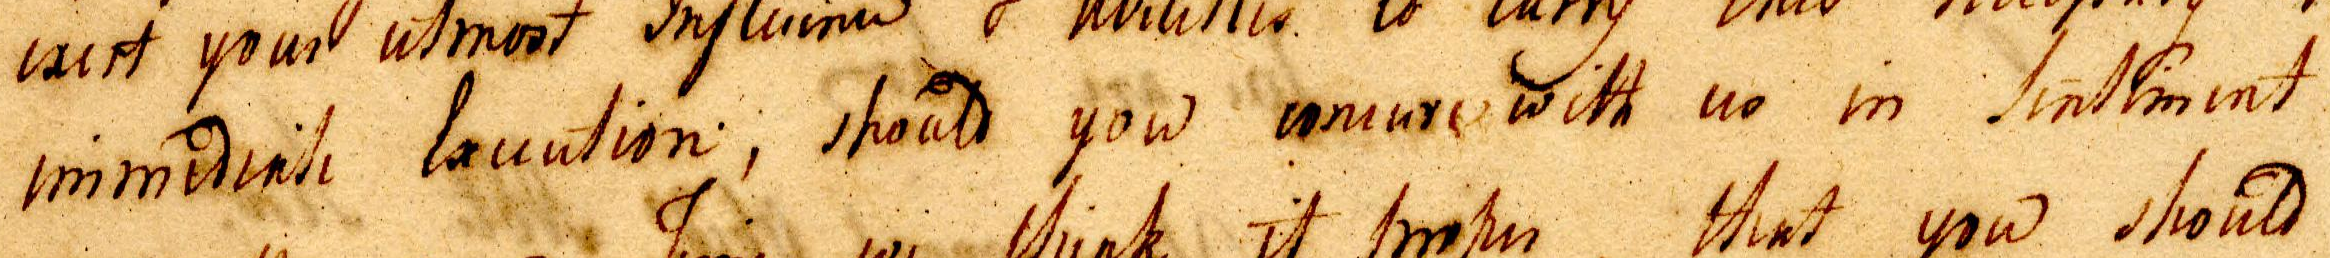immediate Execution, should you concure with us in Sentiment.
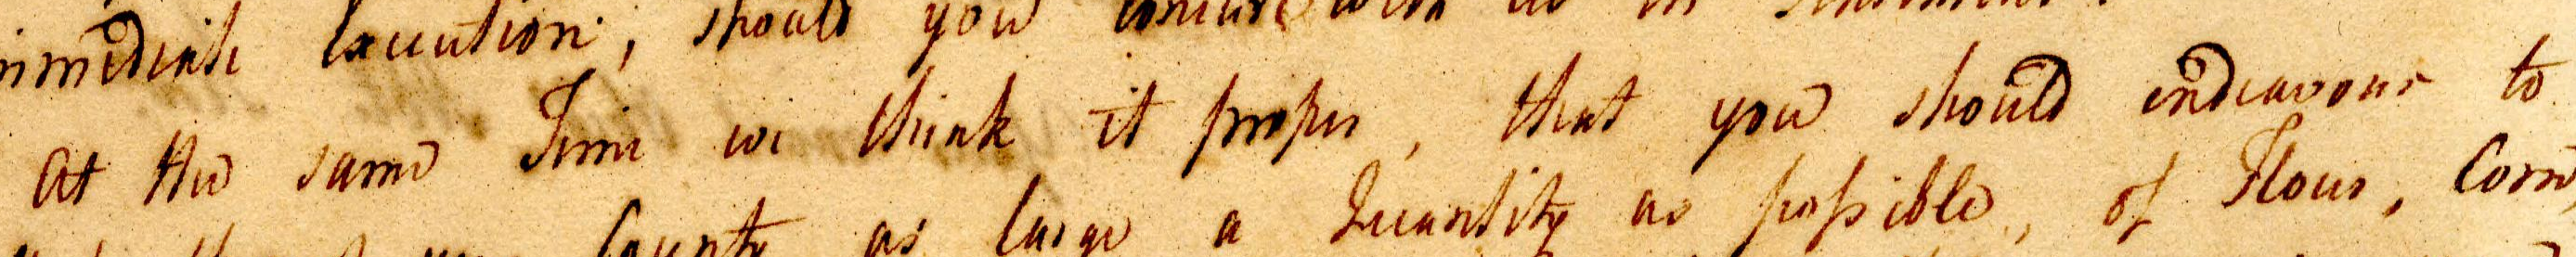At the same Time we think it proper, that you should endeavour to
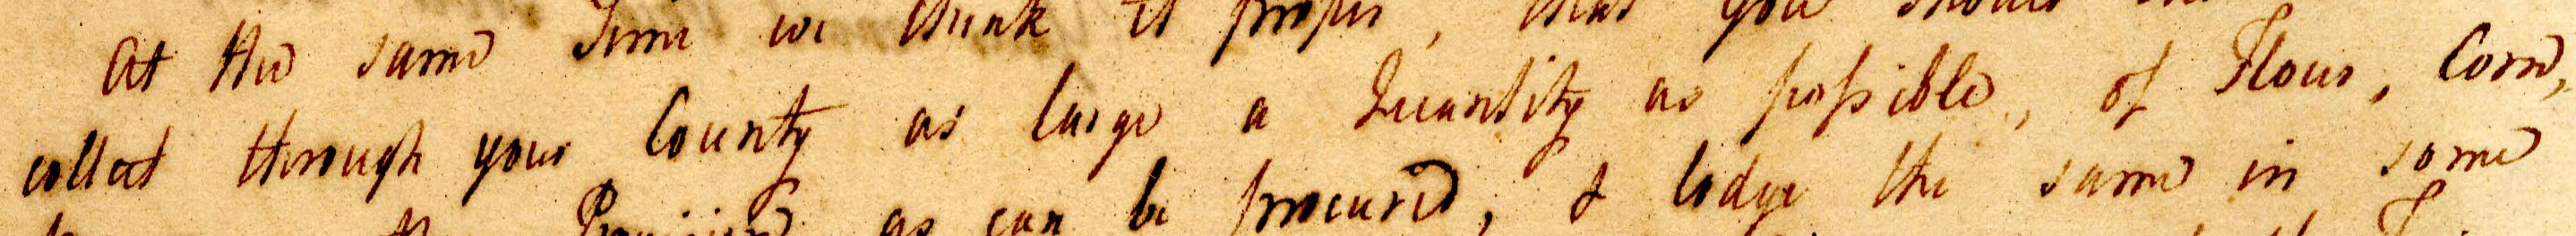collect through your County as large a Quantity as possible, of Flour, Corn
